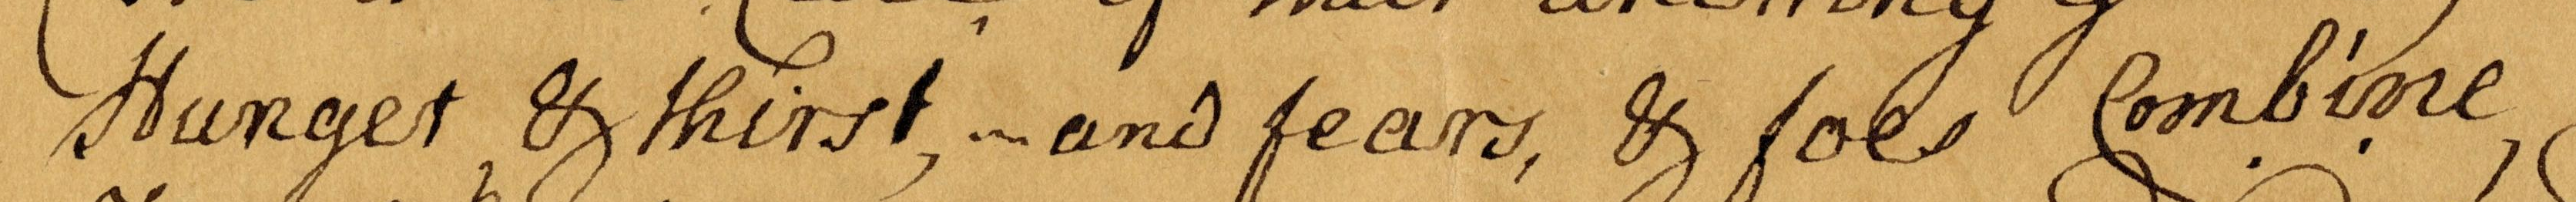Hunger & thirst,~ and fears, & foes Combine
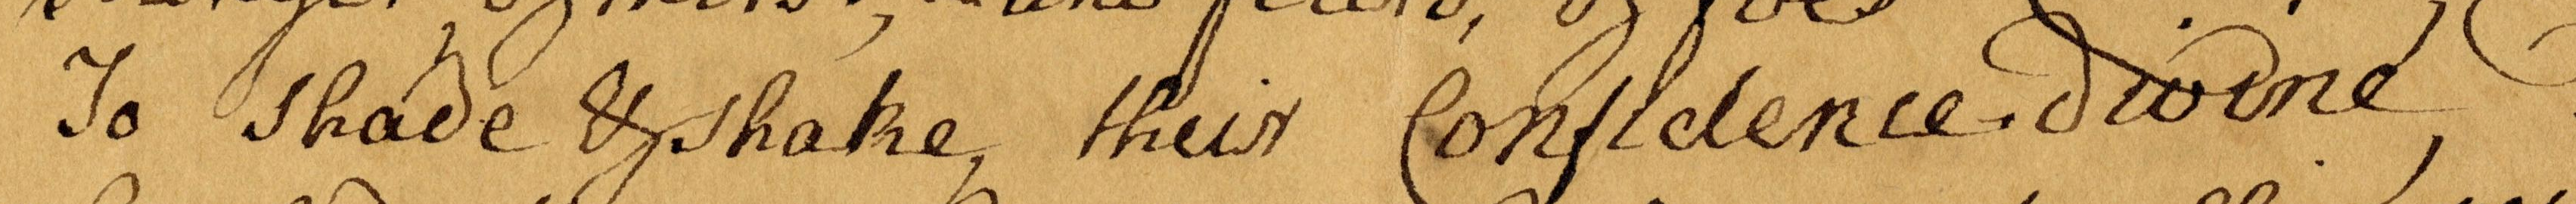To shade & shake, their Confidence, divind,
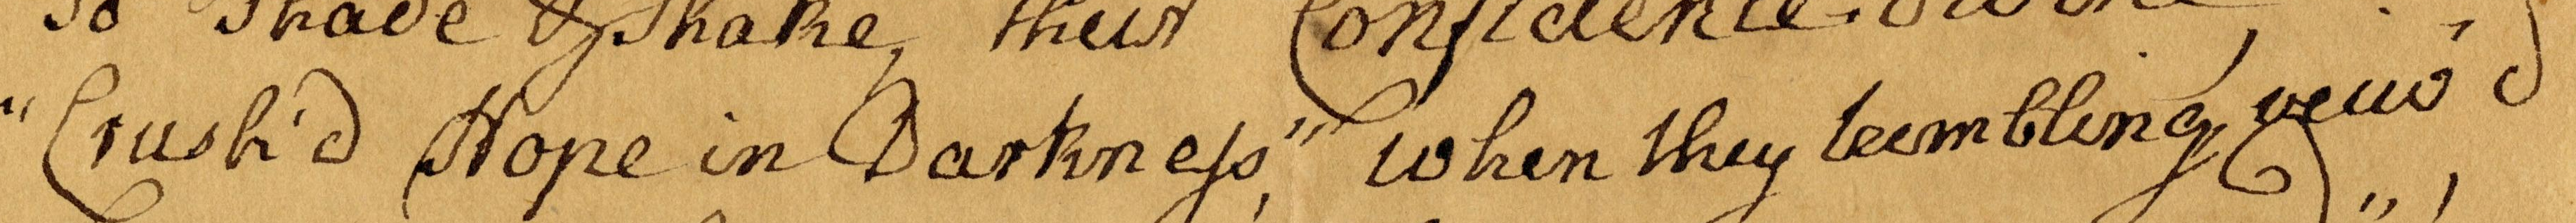"Crush'd Hope in Darkness," when they trembling veiw
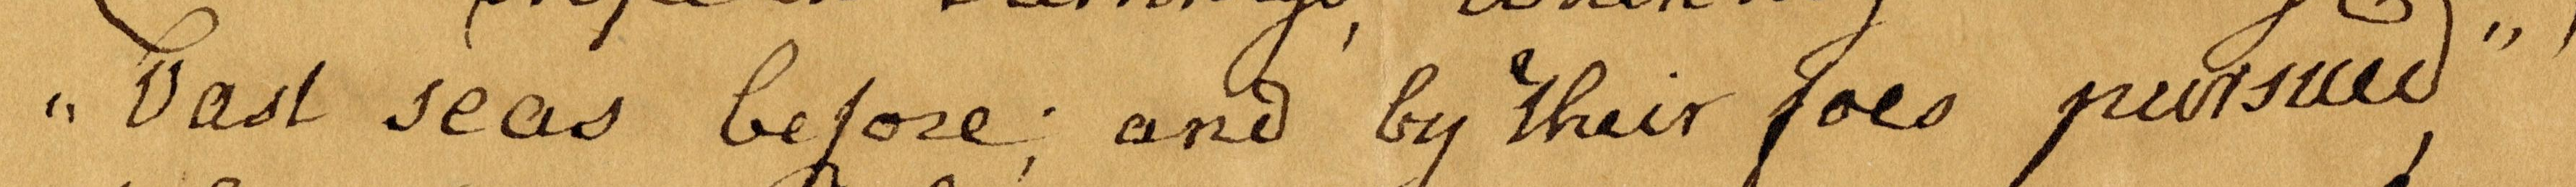"Vast seas before; and by their foes pursued,"
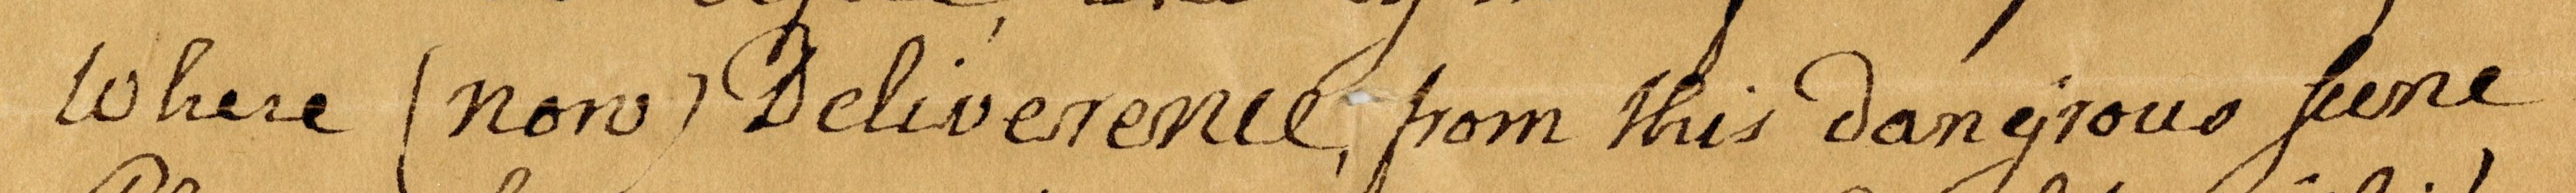Where (now Deliverence, from this dang'rous scene
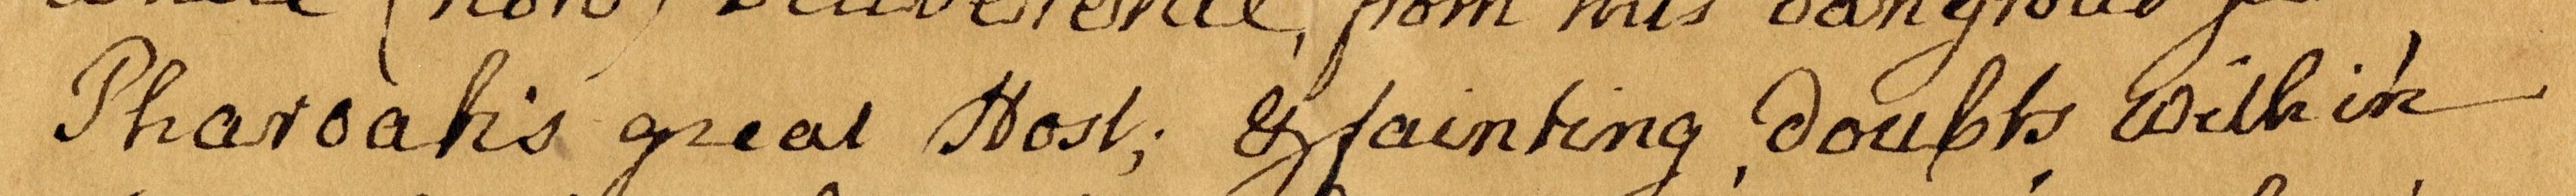Pharoah's great Host; & fainting, doubts wilk in
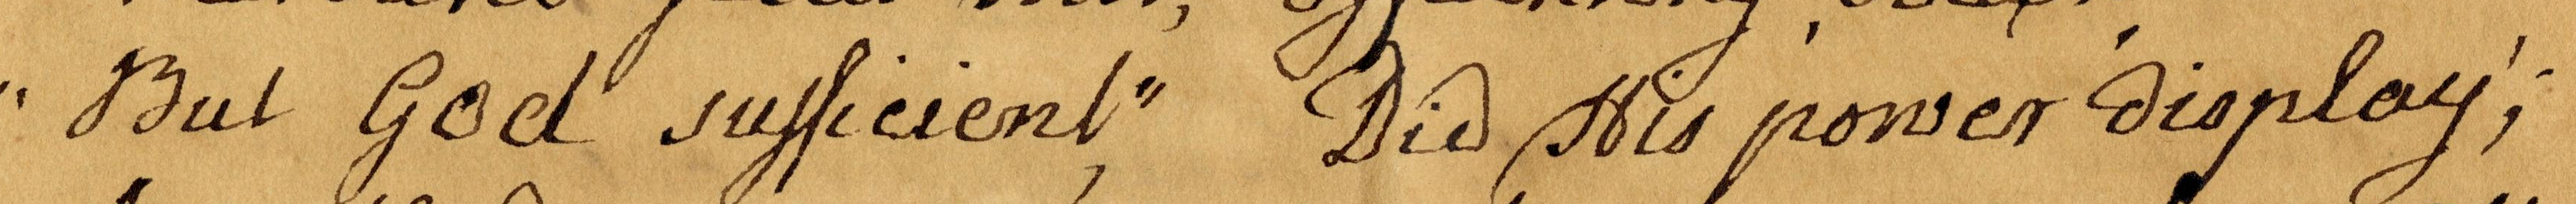"But God sufficient," Did His power display,-
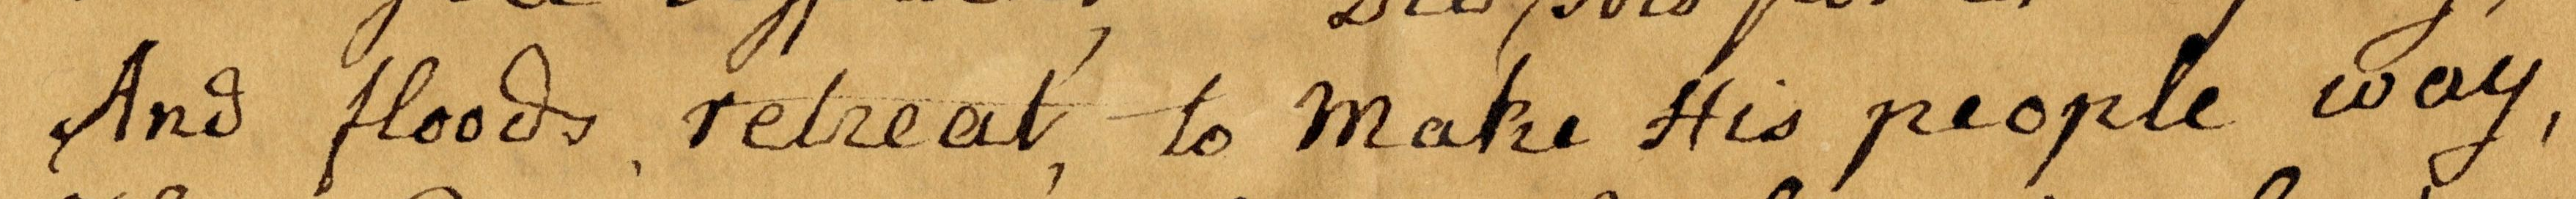And floods retreat, to Make His people way,
